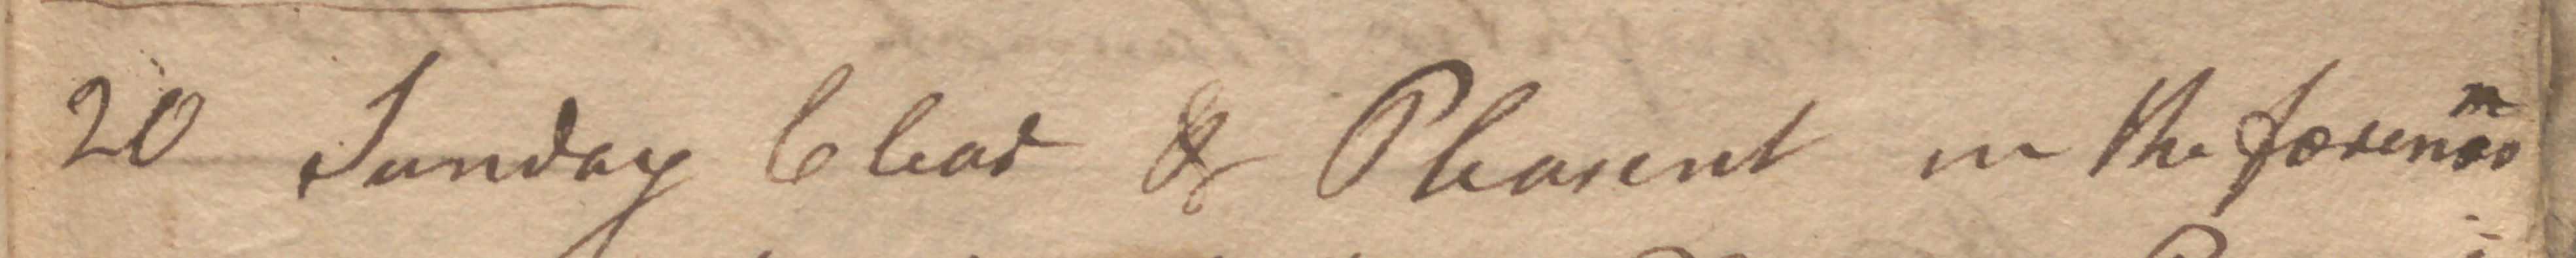20 Sunday Clear & Pleasent in the forenoo^n
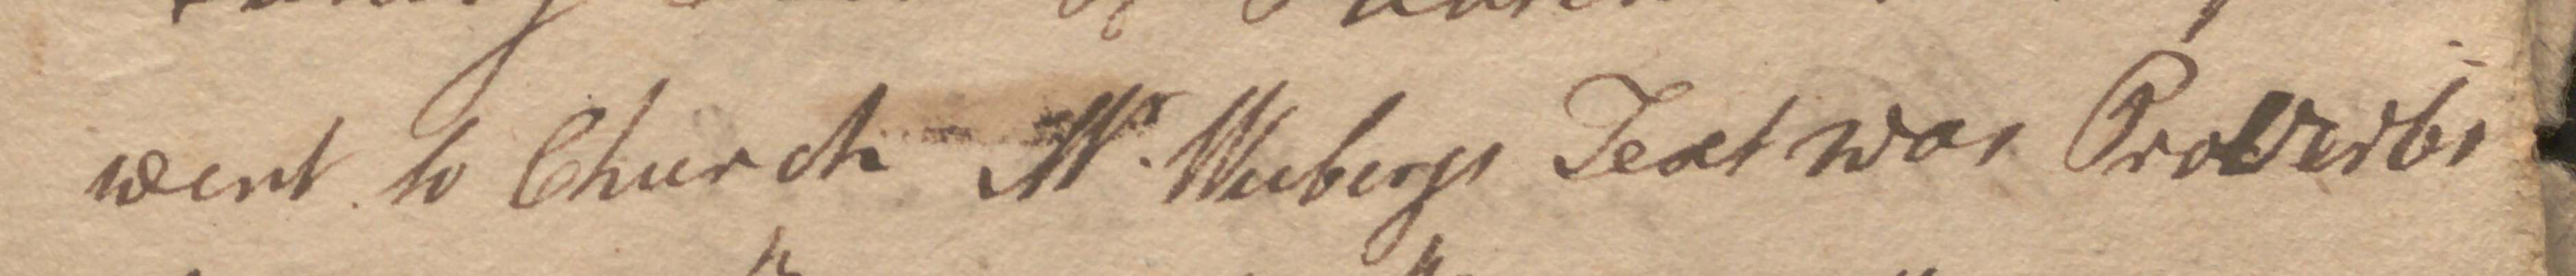went to Church M^r. Weibergs Text was Proverbs
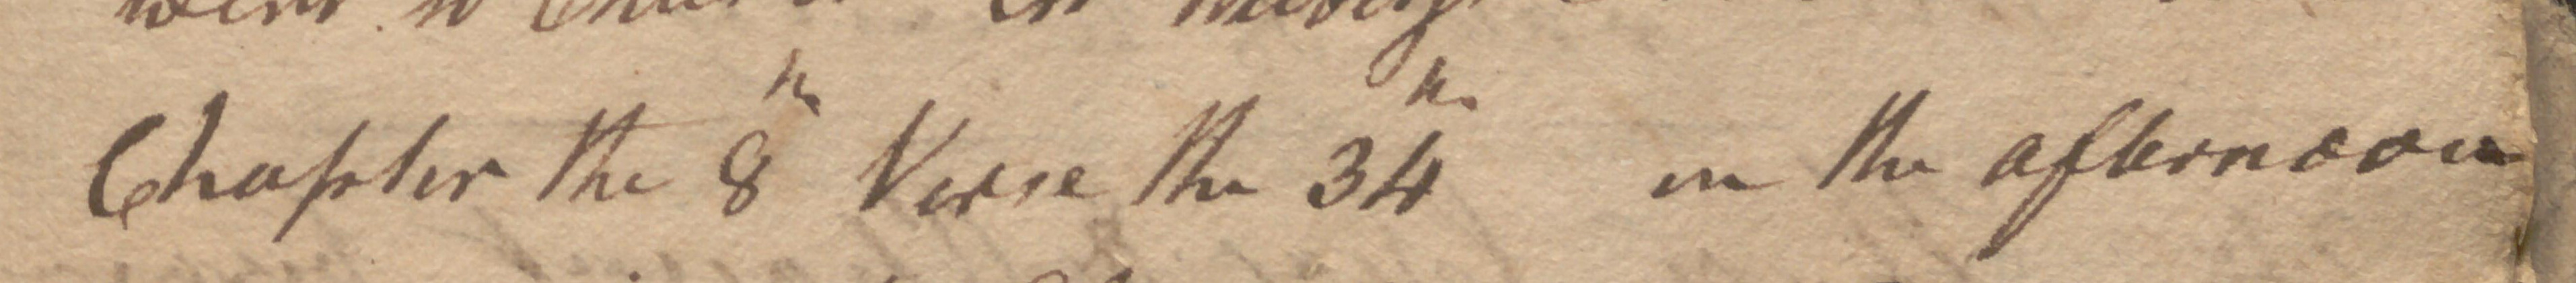Chapter the 8^th Verse the 34^th in the afternoon
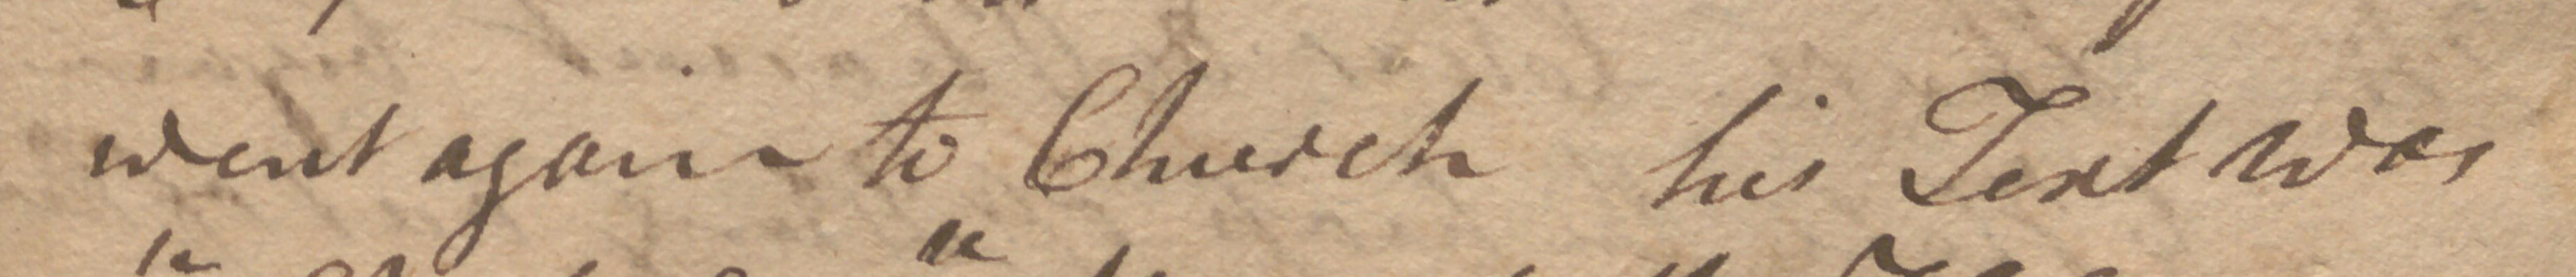went again to Church his Text was
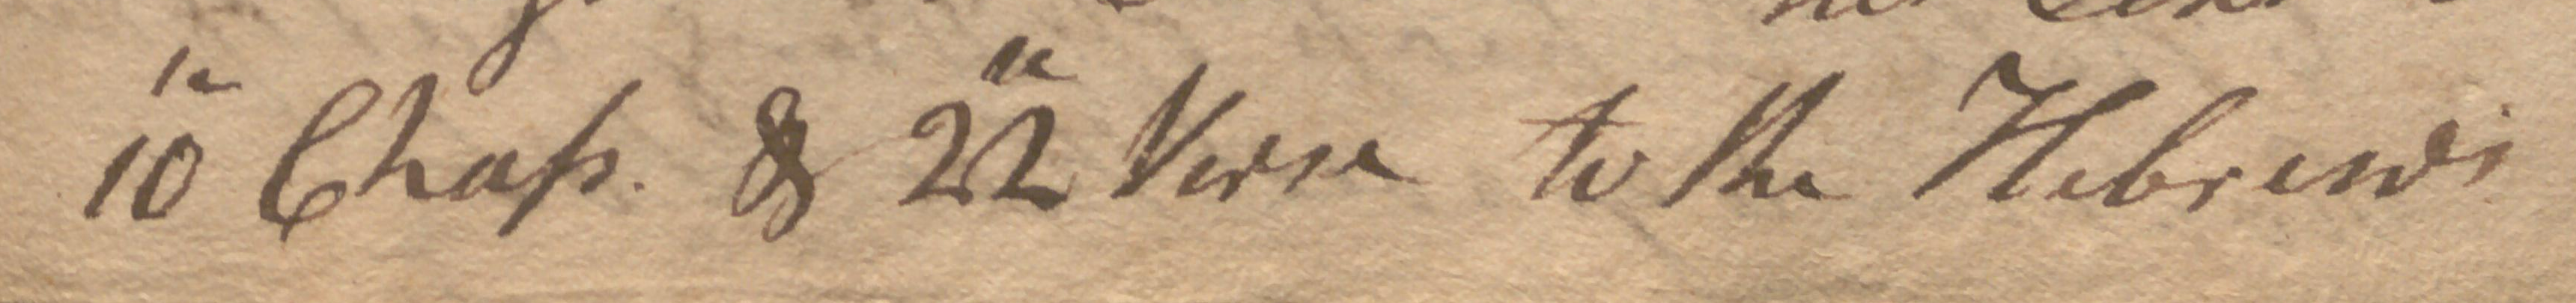10^th Chap. & 22^th Verse to the Hebrews
